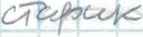старик
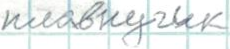плавнучик
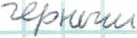черныш
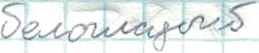белогладый
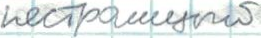пестролицый
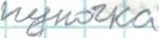пуночка
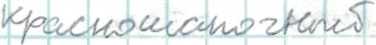красношапочный
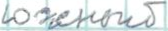южный
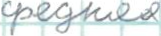средняя
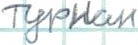турнан
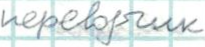перевозчик
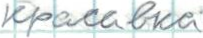красавка
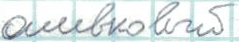оливковый
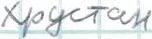хрустан
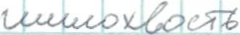шилохвость
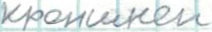кроншнеп
